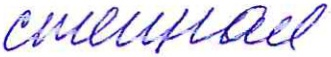степная
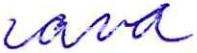гага
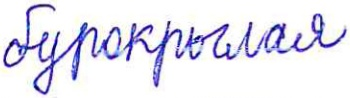бурокрылая
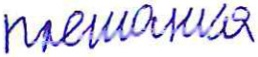плешанкя
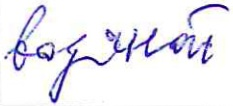водяной
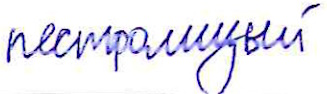пестролицый
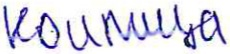колпица
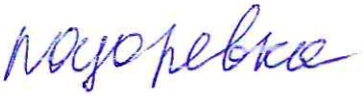лазоревка
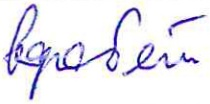воробей
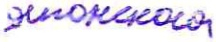японская
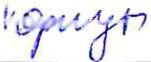кориун
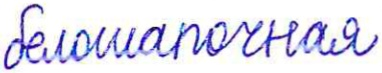белошапочная
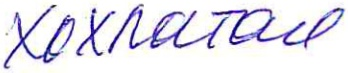хохлатая
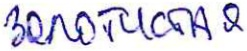золотистая
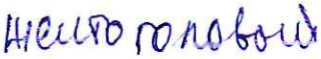желтоголовый
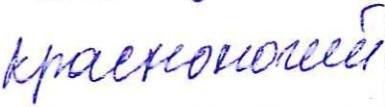красноногий
